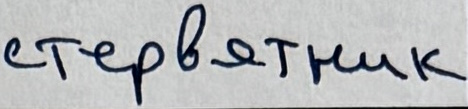стервятник
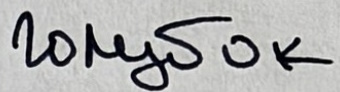голубок
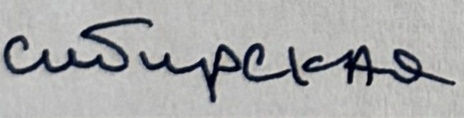сибирская
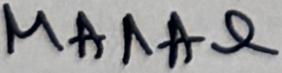малая
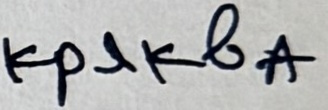кряква
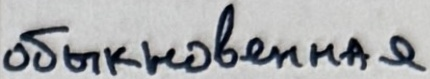обыкновенная
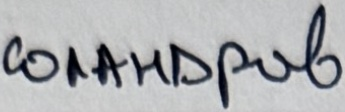соландров
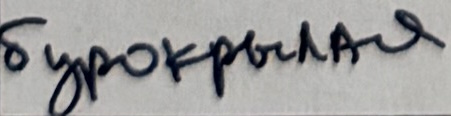бурокрылая
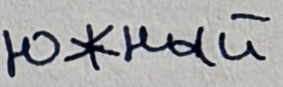южный
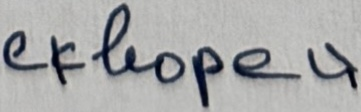скворец
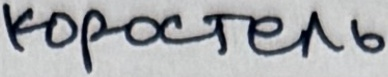коростель
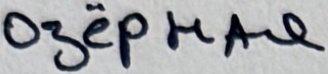озёрная
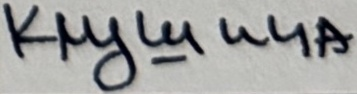клушица
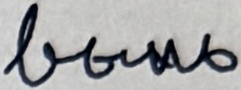выпь
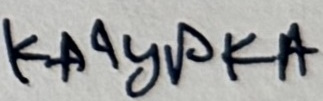качурка
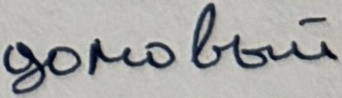домовый
